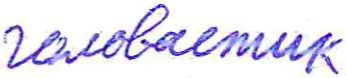головастик
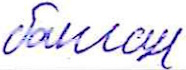баклан
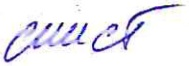ашст
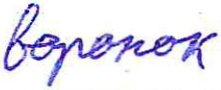воронок
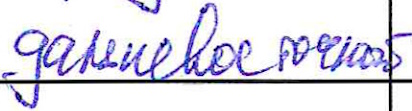дальневосточный
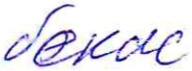бекас
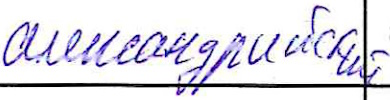александрийский
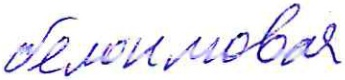белоклювая
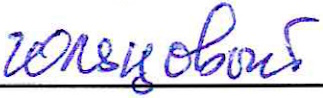гольцовый
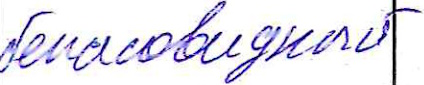бекасовидный
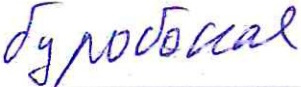буробокая
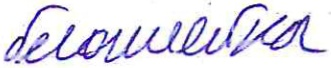белошейка
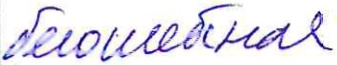белошейная
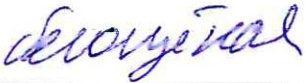белоцекая
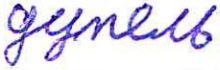дупель
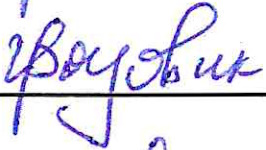грязовик
